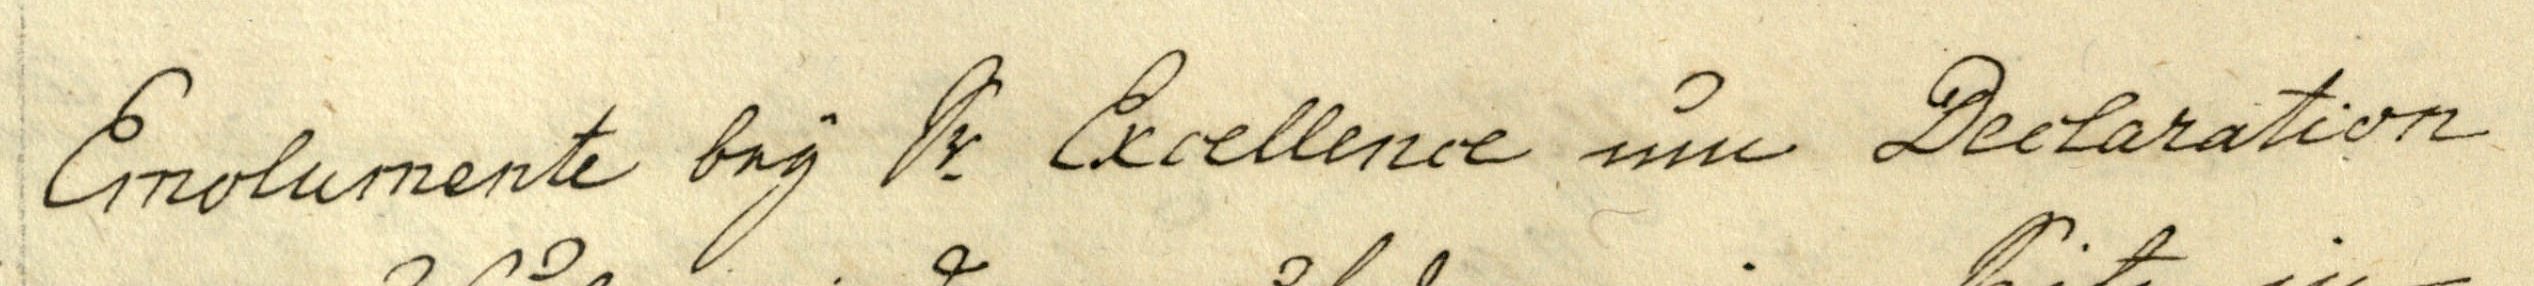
Emolumente beÿ Sr Excellence um Declaration
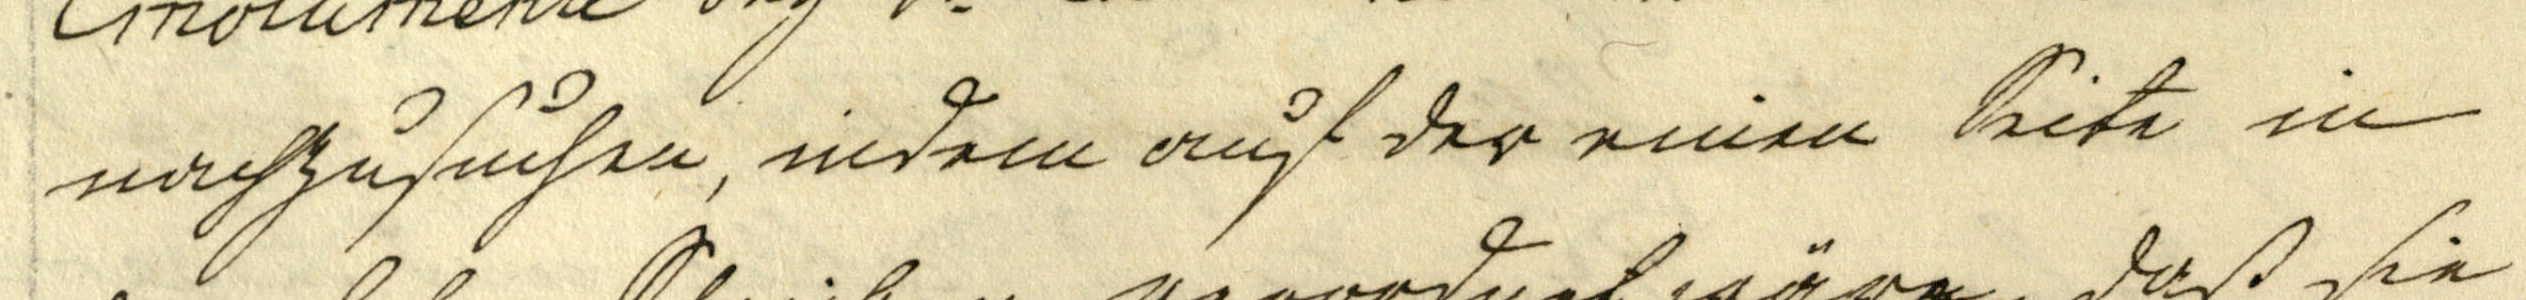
nachzusuchen, indem auf der einen Seite in
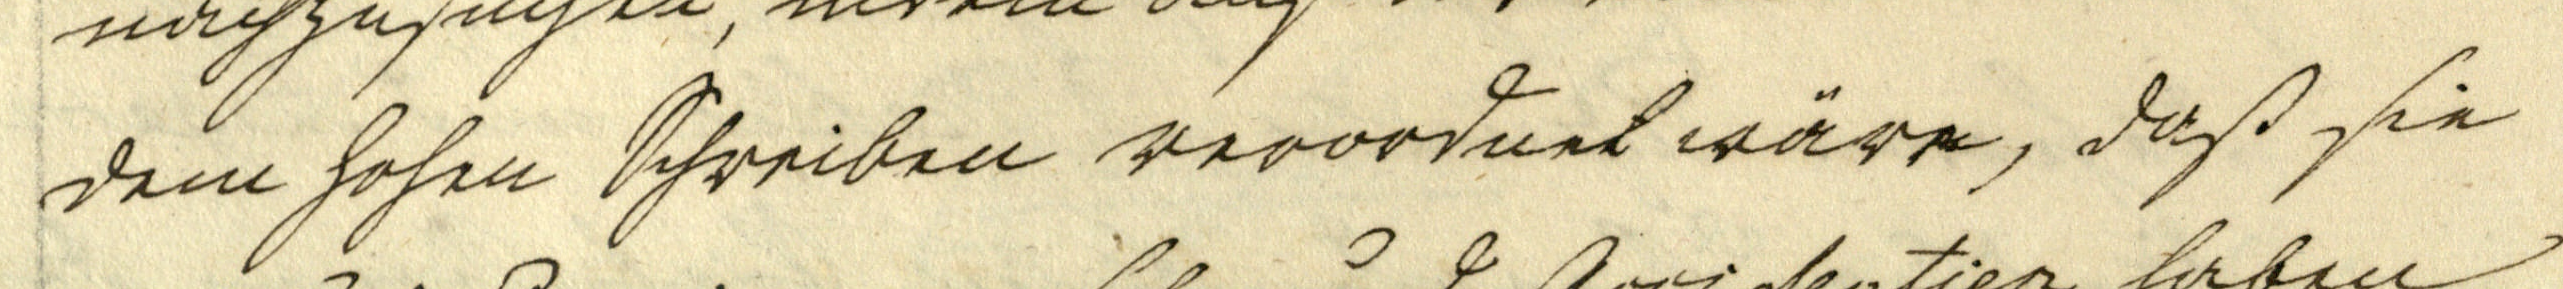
dem hohen Schreiben verordnet wäre, daß sie
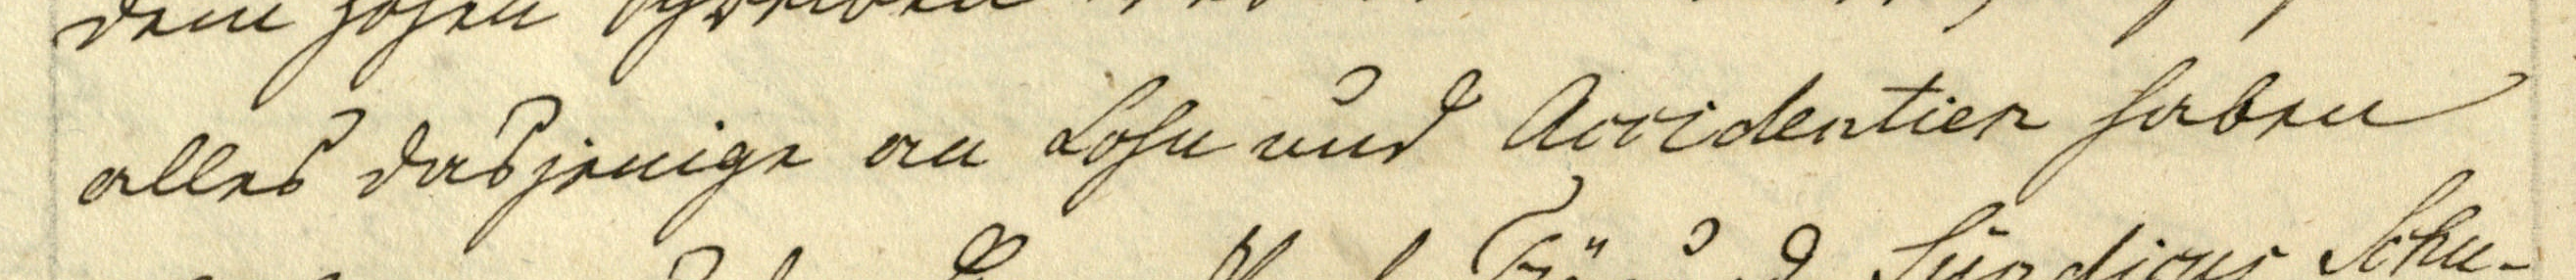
alles dasjenige an Lohn und Accidentien haben
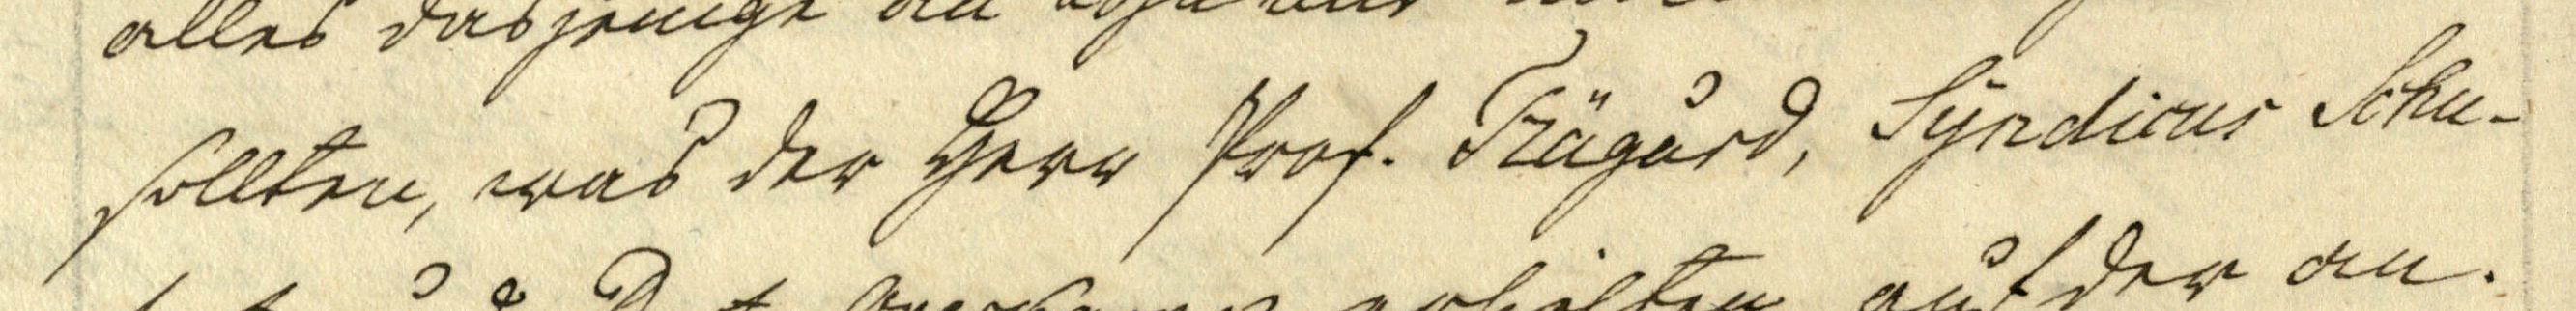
sollten, was der Herr Prof. Trägård, Sÿndicus Schu¬
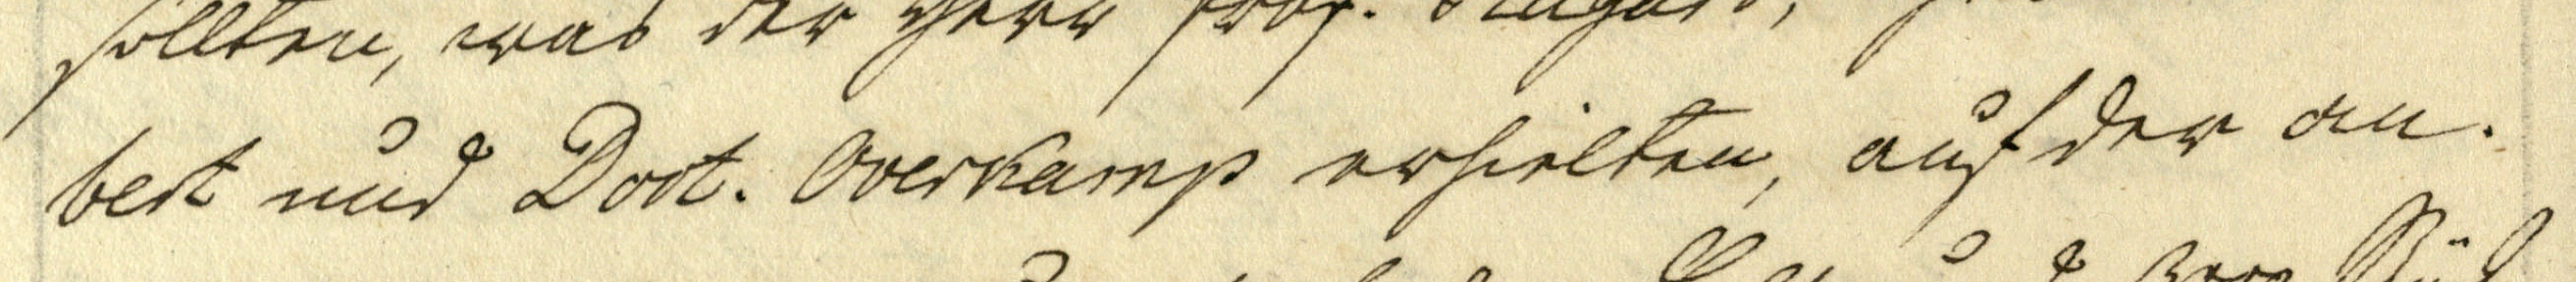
bert und Doct. Overkamp erhielten, auf der an¬
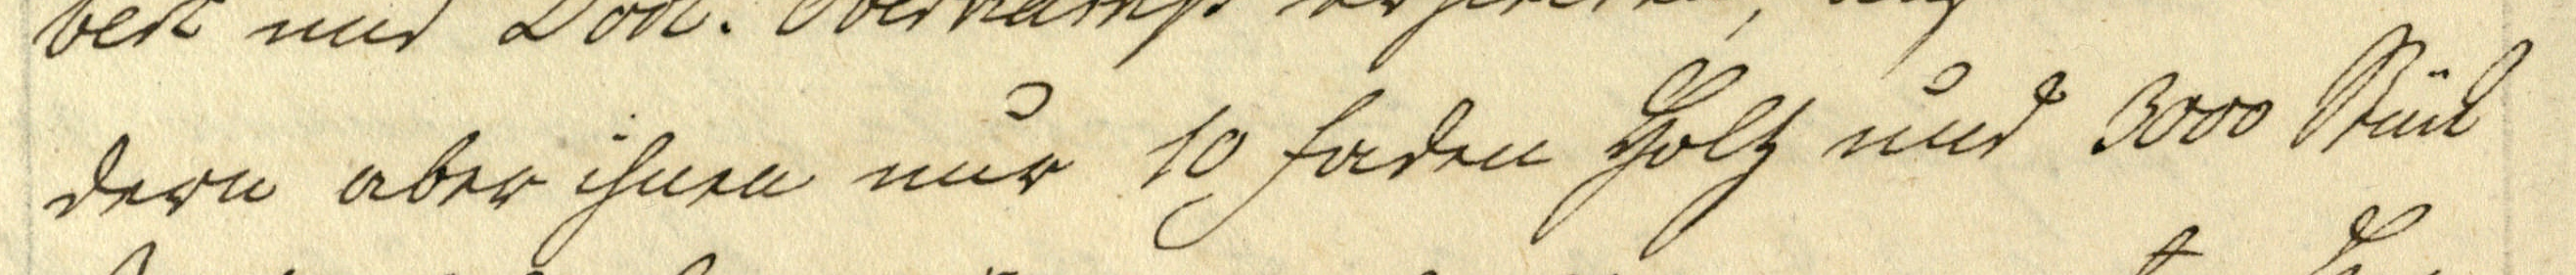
dern aber ihnen nur 10 Faden Holz und 3000 Stück
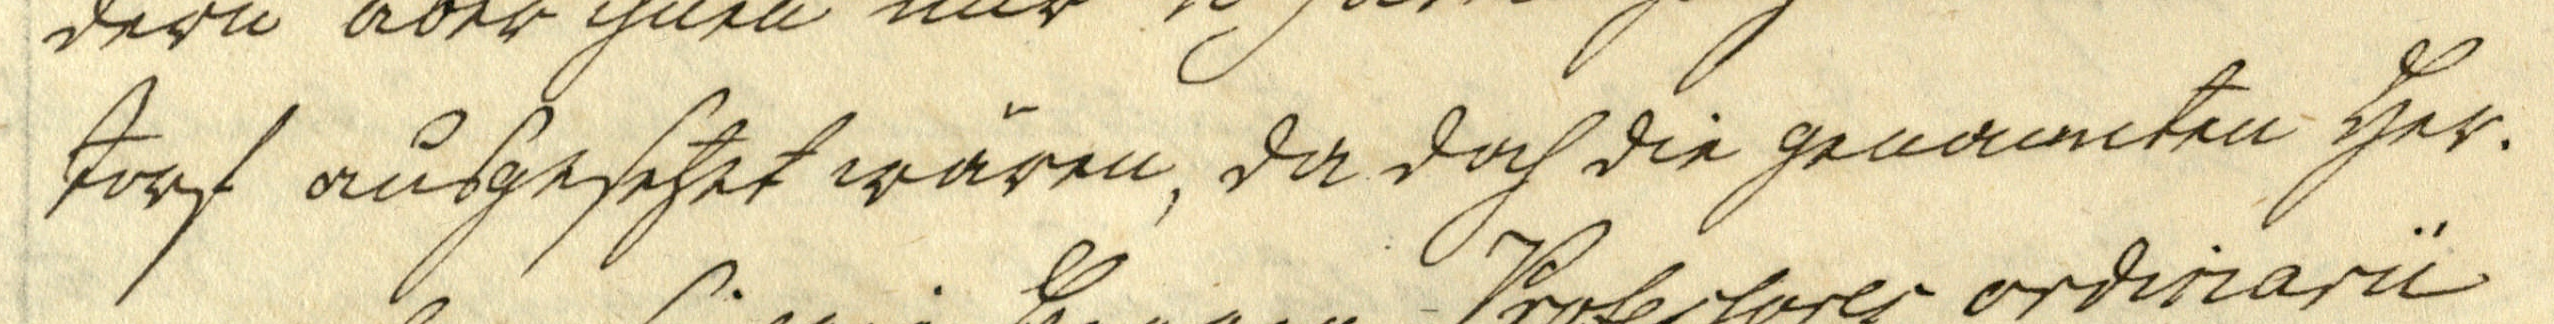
Torf ausgesetzet wären, da doch die genannten Her¬
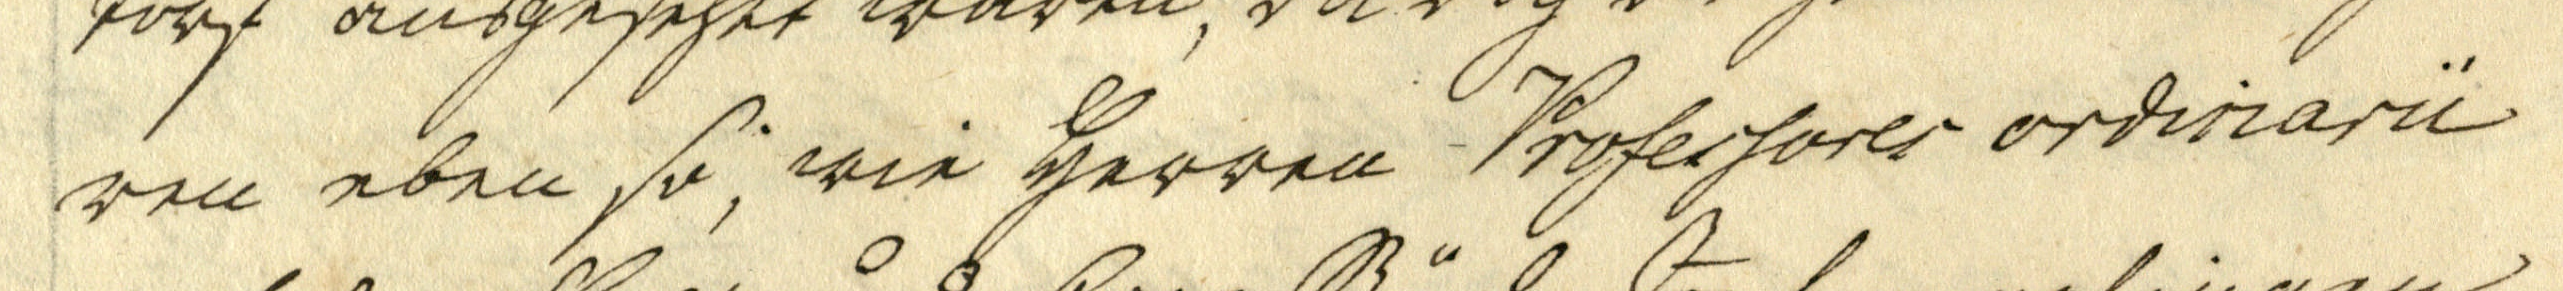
ren eben so, wie Herren Professores ordinarii
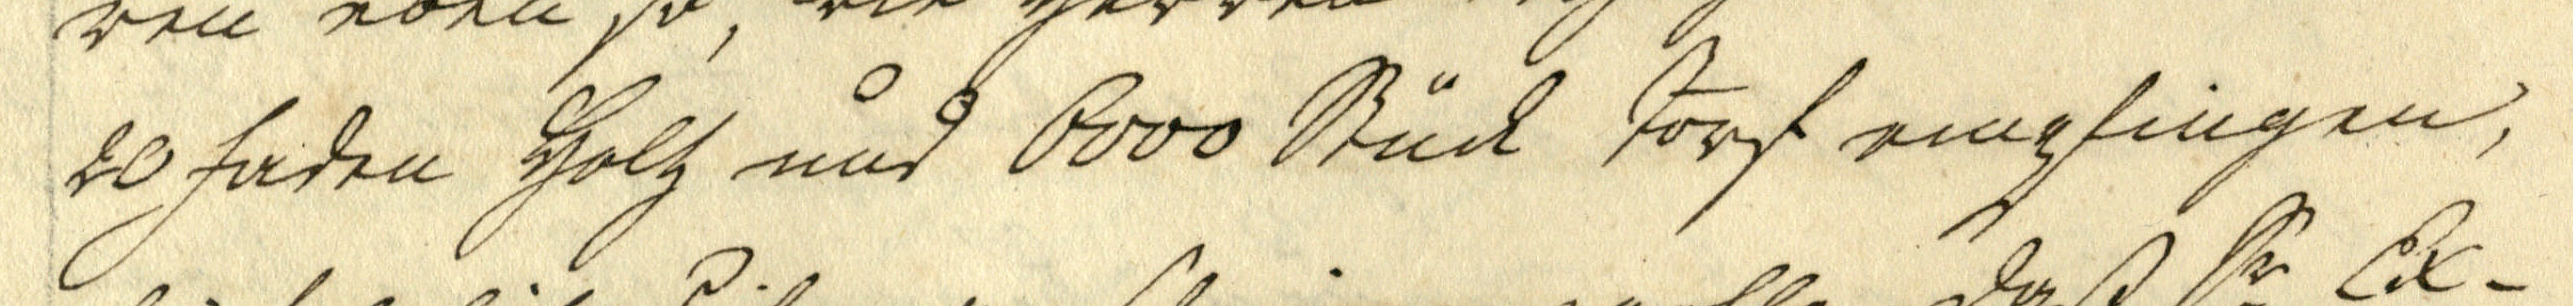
20 Faden Holz und 6000 Stück Torf engfingen,
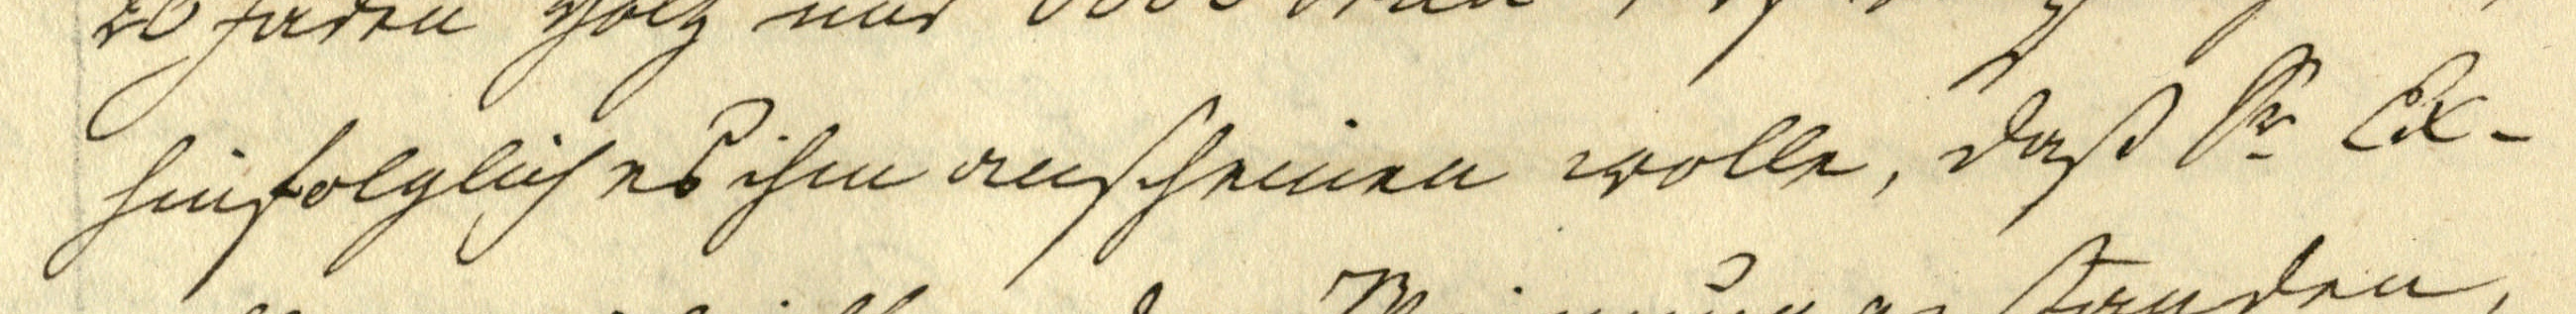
hinfolglich es ihm anscheinen wolle, daß Sr Ex¬
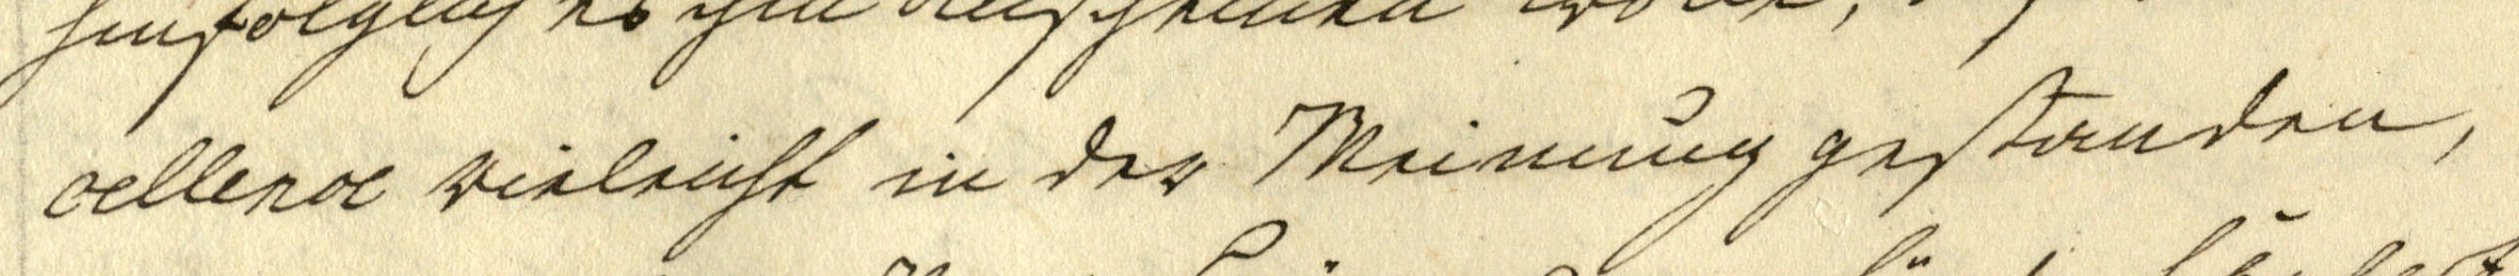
cellence vieleicht in der Meinung gestanden,
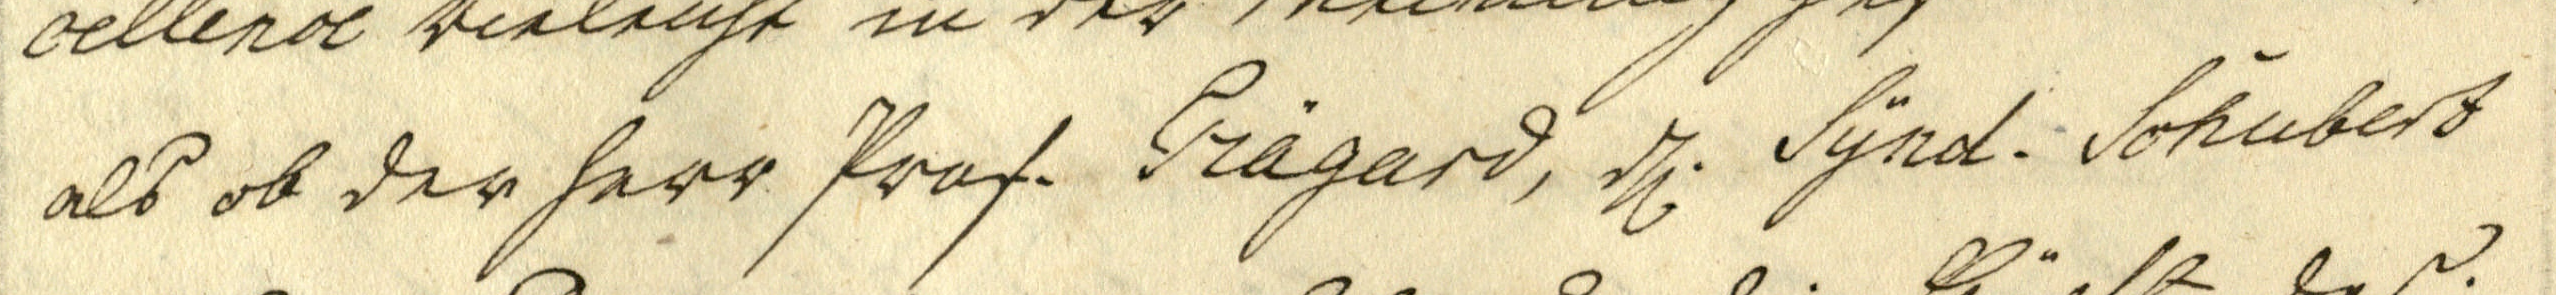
als ob der Herr Prof. Trägård, dh. Sÿnd. Schubert
